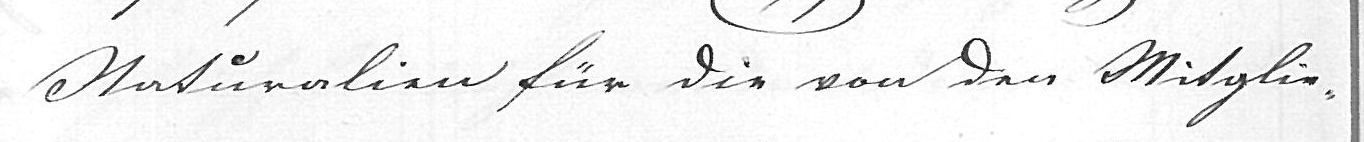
Naturalien für die von den Mitglie-
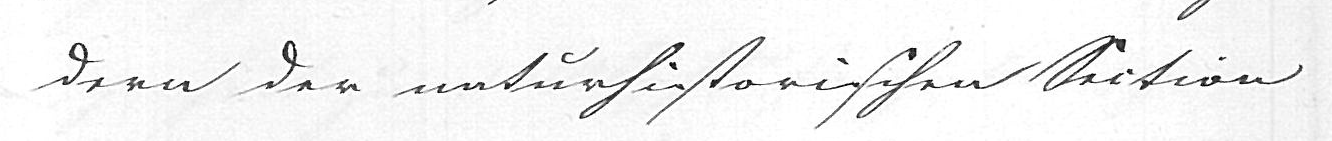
dern der naturhistorischen Section
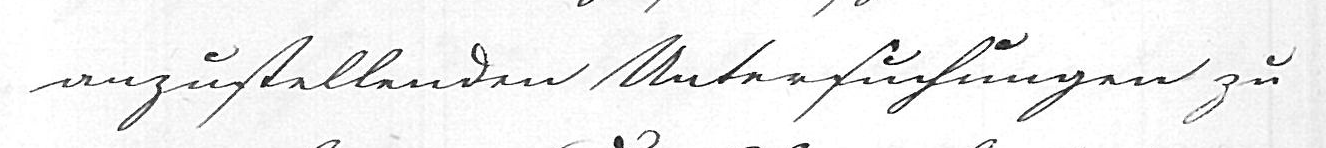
anzustellenden Untersuchungen zu
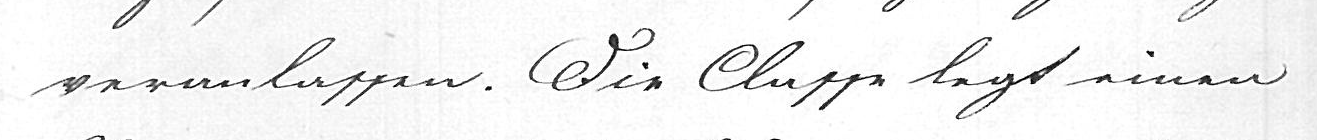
veranlassen. Die Classe legt einen
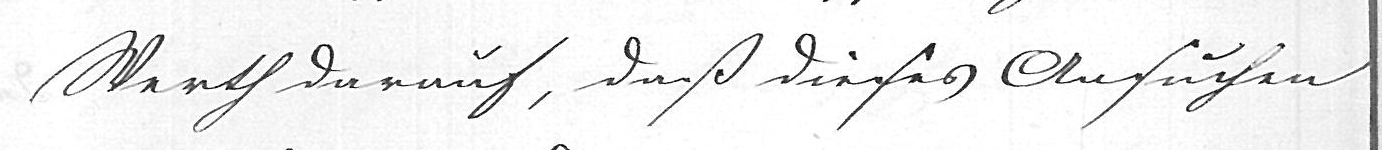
Werth darauf, daß dieses Ansuchen
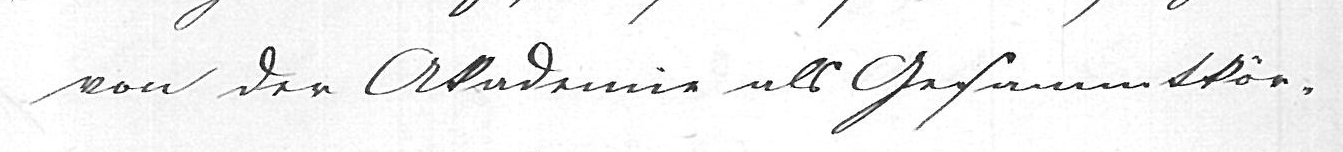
von der Akademie als Gesammtkör-
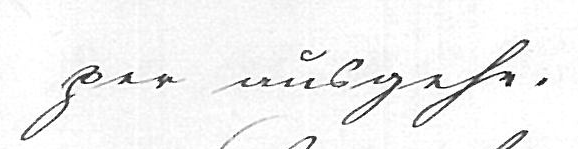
per ausgehe.
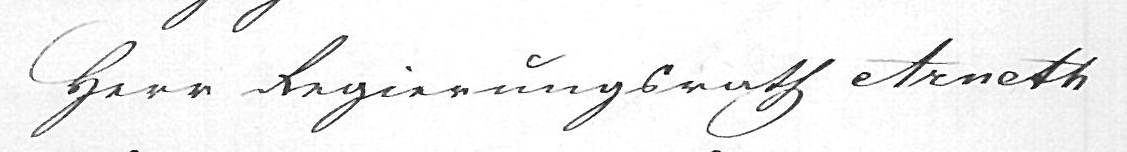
Herr Regierungsrath Arneth
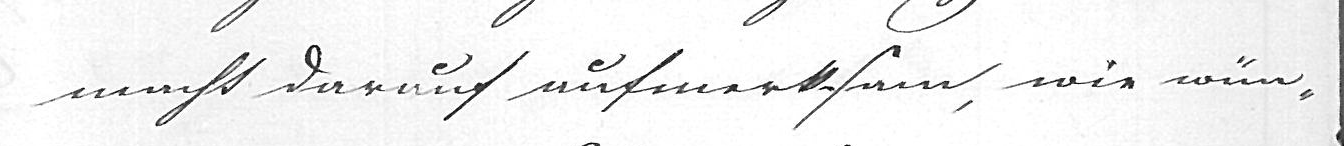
macht darauf aufmerksäm, wie wün-
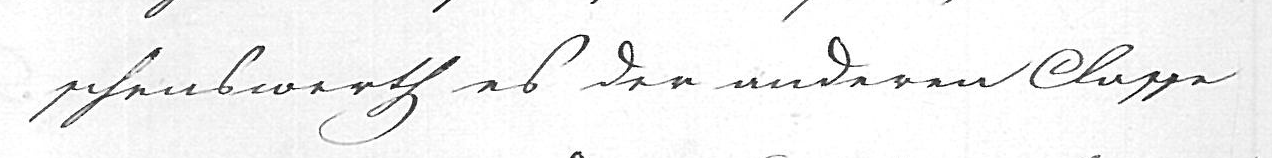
schenswerth es der anderen Classe
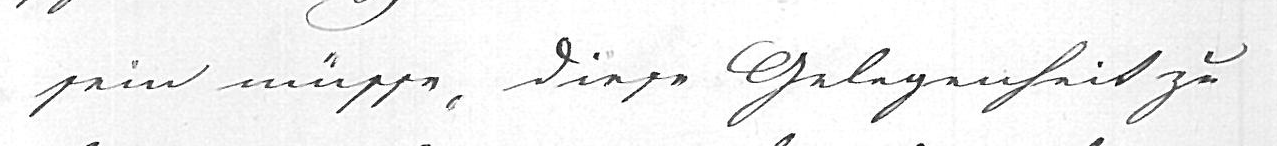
sein müsse, diese Gelegenheit zu
